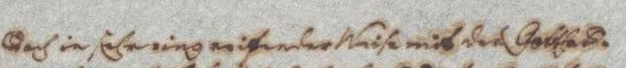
doch in sehr eingreifender Weise mit der Gotthard -
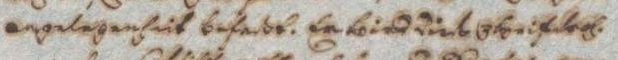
angelegenheit befaßt. Er wird dieß zweifelsoh-
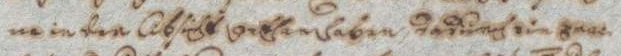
ne in der Absicht gethan haben, dadurch ein prac-
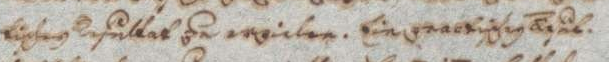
tisches Resultat zu erzielen. Ein practisches Resul-
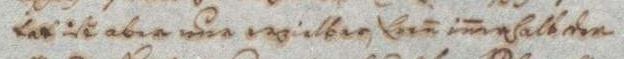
tat ist aber nur erzielbar, wenn innerhalb der
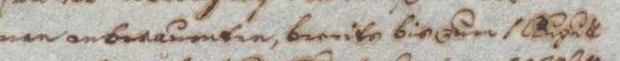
nen anberaumten, bereits bis zum 1 August
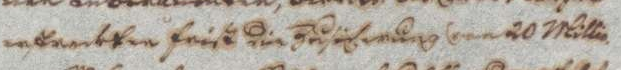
erstreckten Frist die Zusicherung von 20 Millio-
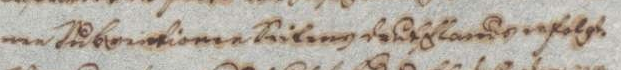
nen Subventionen Seitens Deutschlands erfolgt.
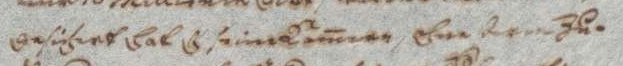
gesichert hat & seine Kammer, ohne deren Zu-
